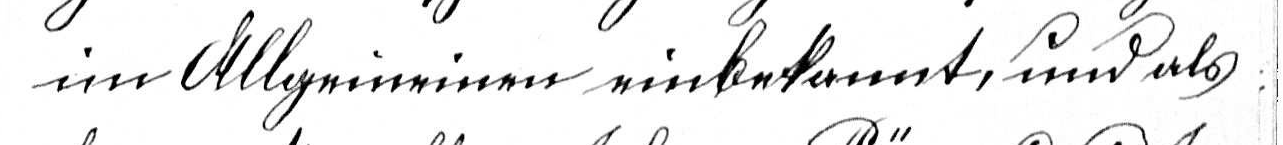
im Allgemeinen einbekannt, und als
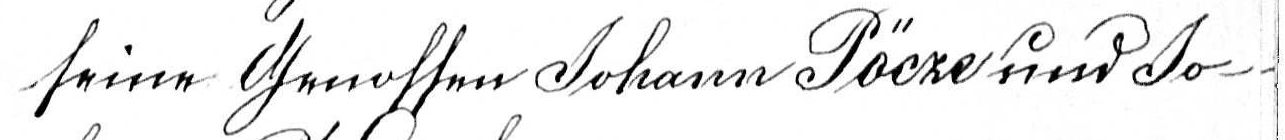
seine Genossen Johann Pöcze und Jo¬
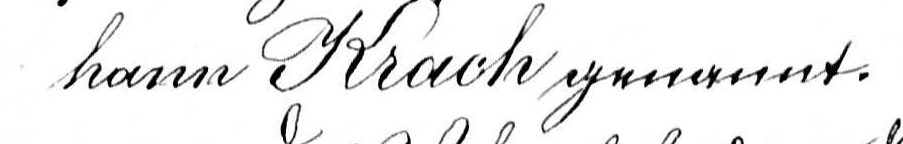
hann Krach genannt.
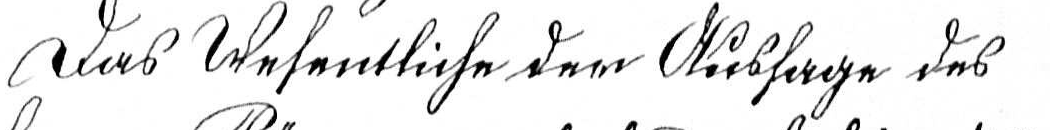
Das Wesentliche der Aussage des
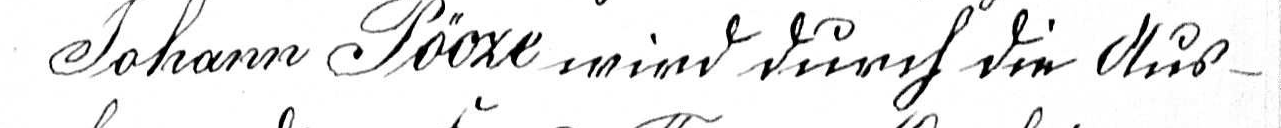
Johann Pöcze wird durch die Aus¬
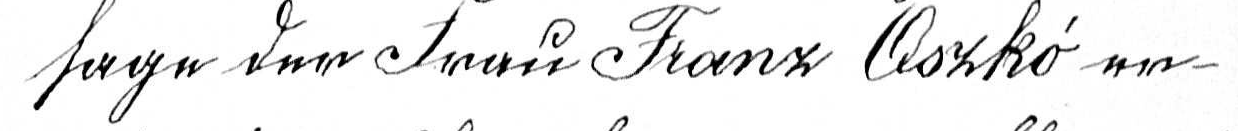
sage der Frau Franz Oszkó er¬
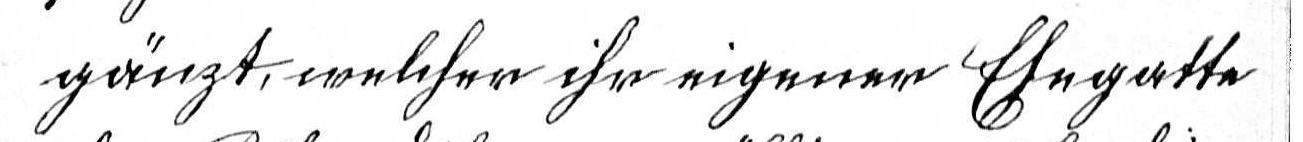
gänzt, welcher ihr eigener Ehegatte
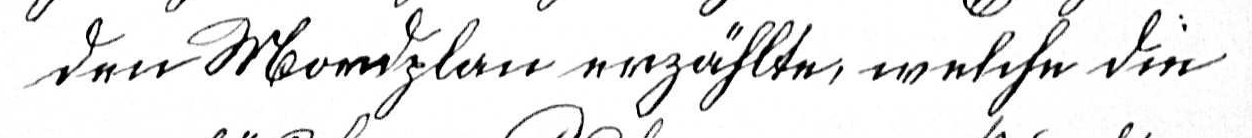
den Mordplan erzählte, welche die
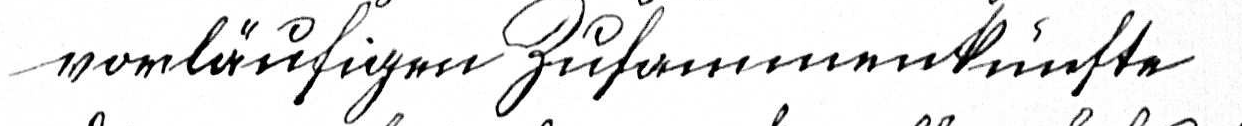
vorläufigen Zusammenkünfte
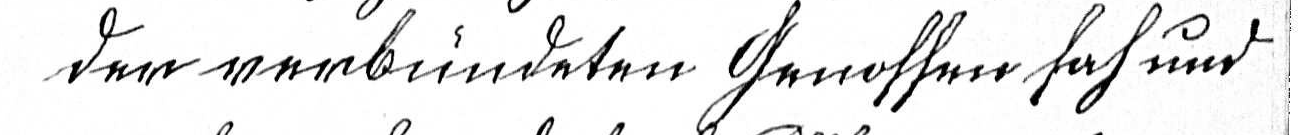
der verbündeten Genossen sah und
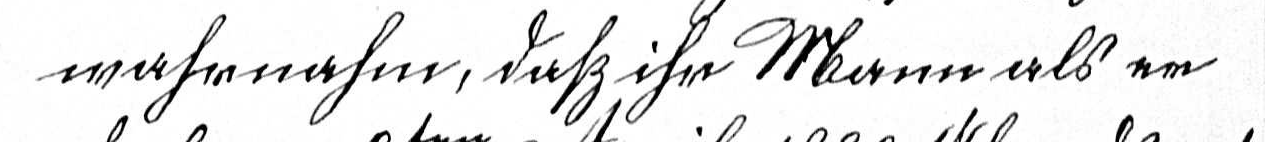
wahrnahm, daß ihr Mann als er
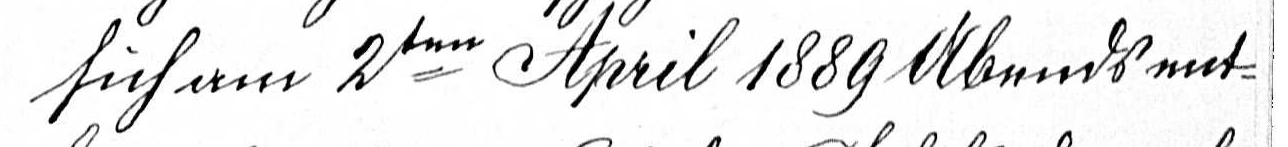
sich am 2ten April 1889 Abends ent¬
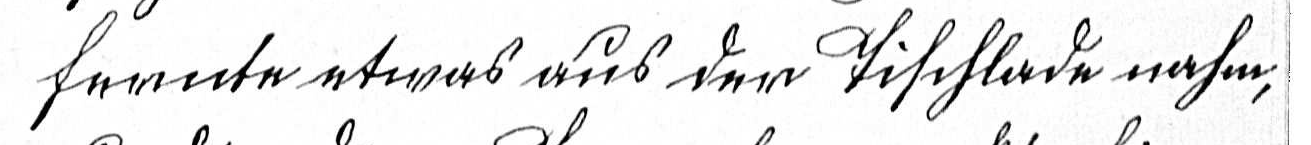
fernte etwas aus der Tischlade nahm,
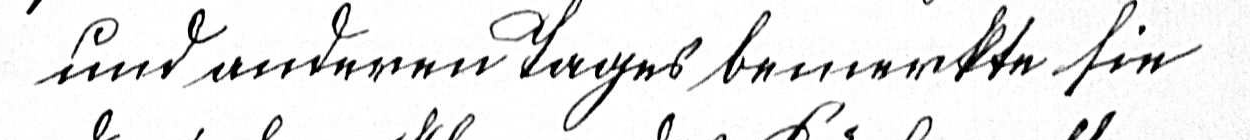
und anderen Tages bemerkte sie
